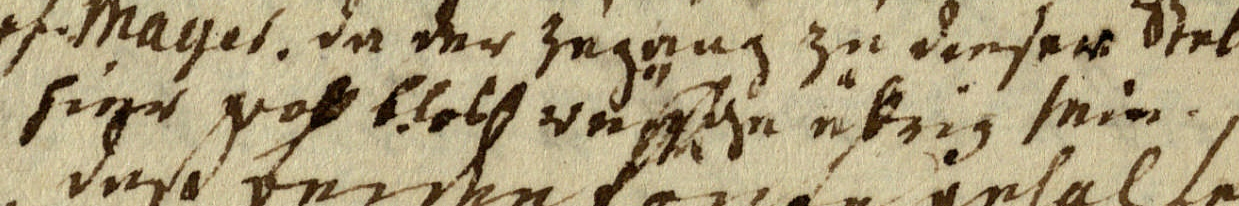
sicher wol blos Wünsche übrig sein.
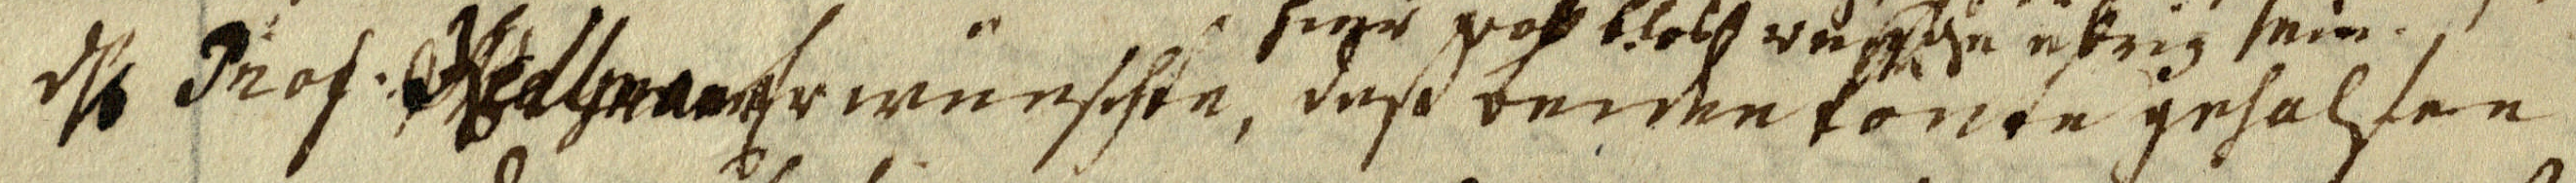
dh Prof. Kellmann. Er wünschte, daß beiden könte geholfen
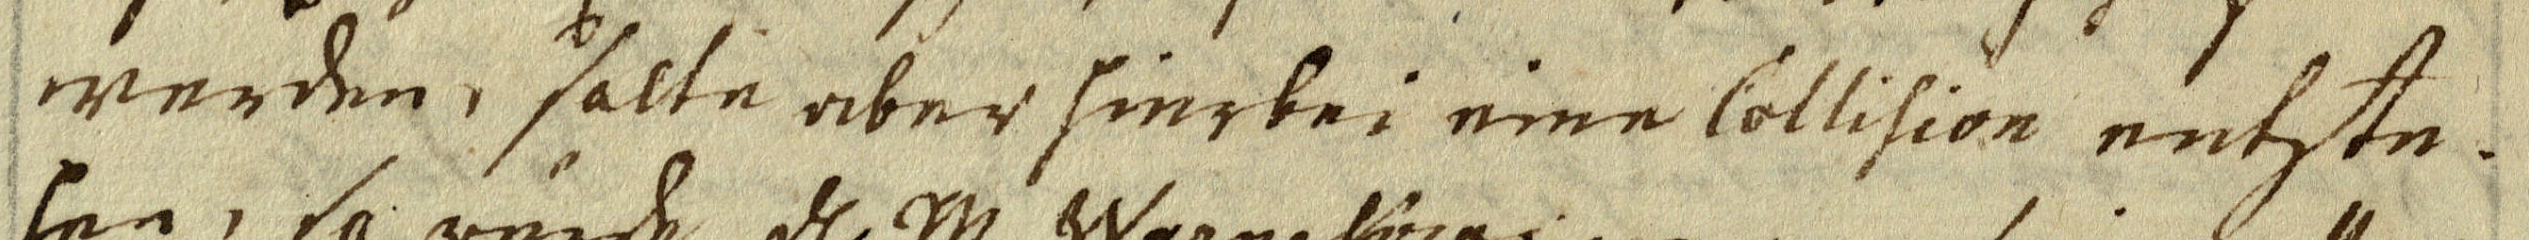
werden, solte aber hierbei eine Collision entste¬
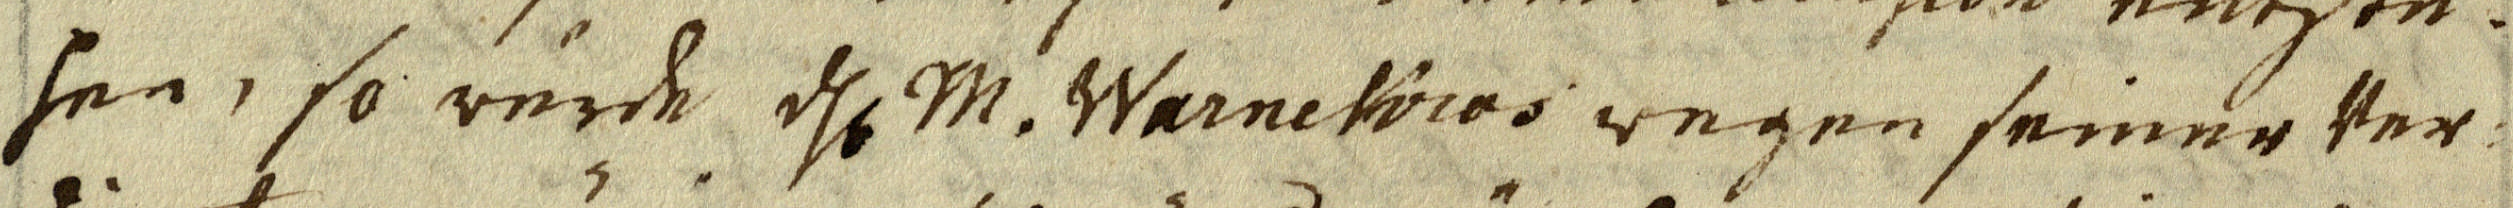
hen, so würde dh M. Warnekros wegen seiner Ver¬
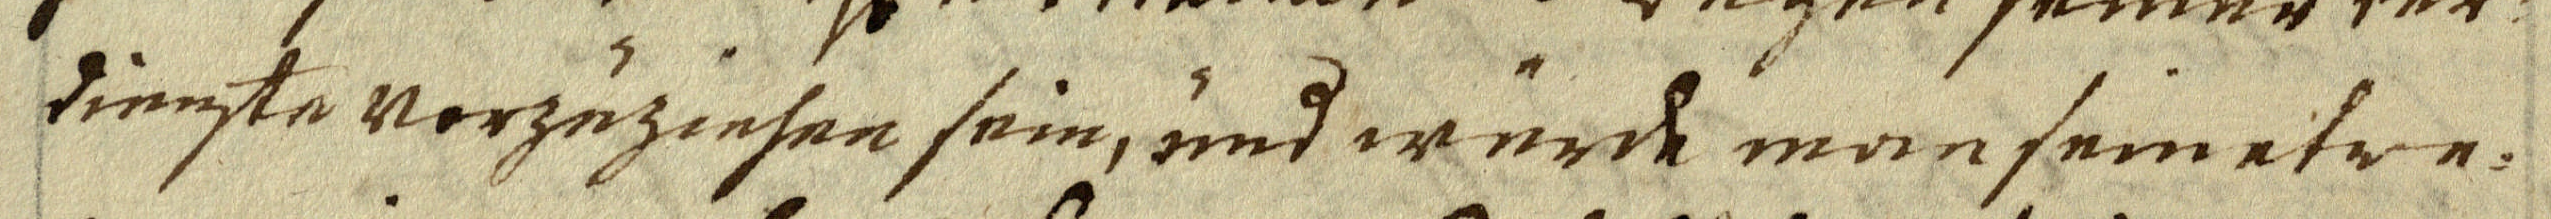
dienste vorzuziehen sein, und würde man seinetwe¬
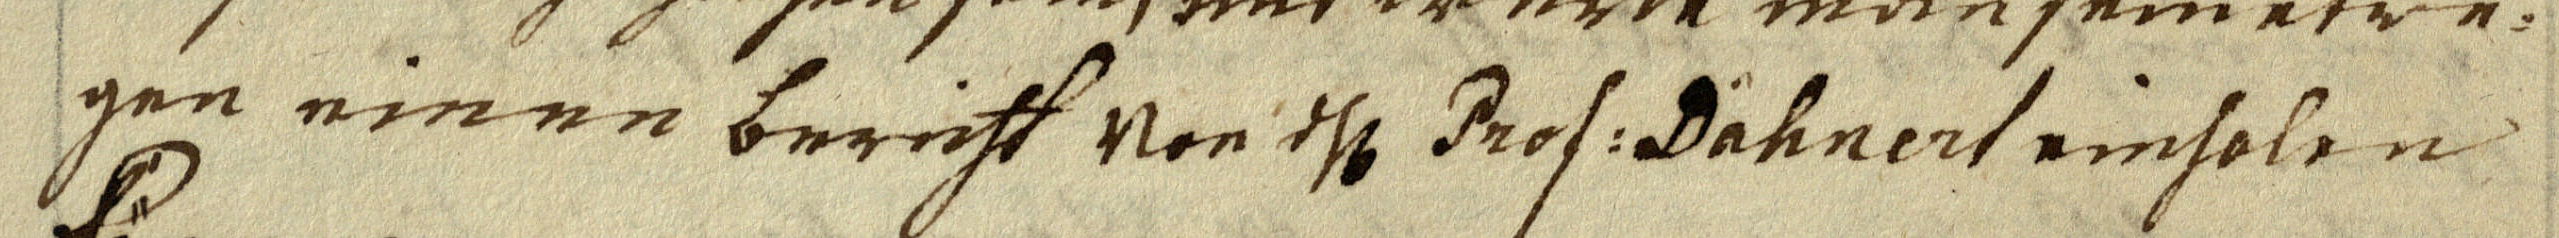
gen einen Bericht von dh Prof. Dähnert einholen
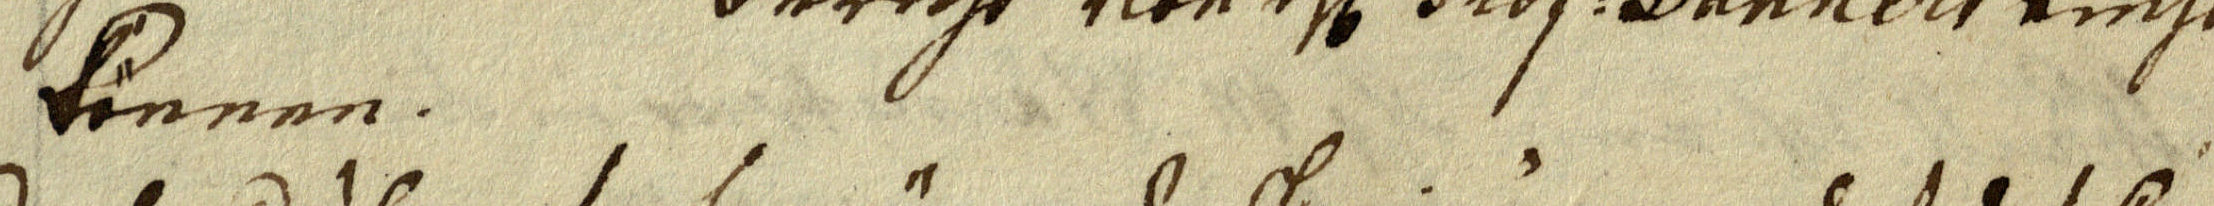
können.
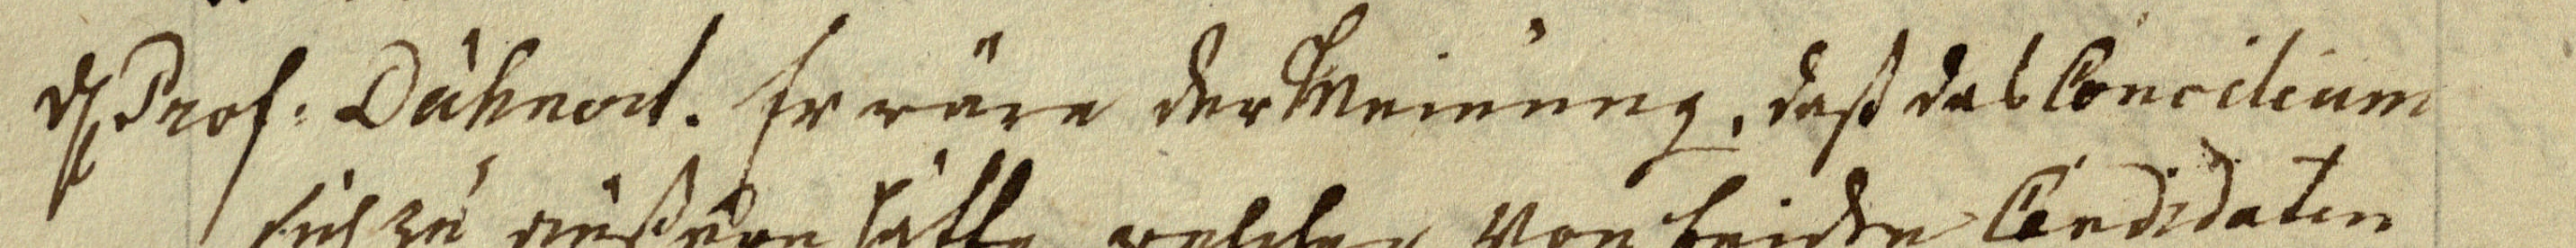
dh Prof. Dähnert. Er wäre der Meinung, daß das Concilium
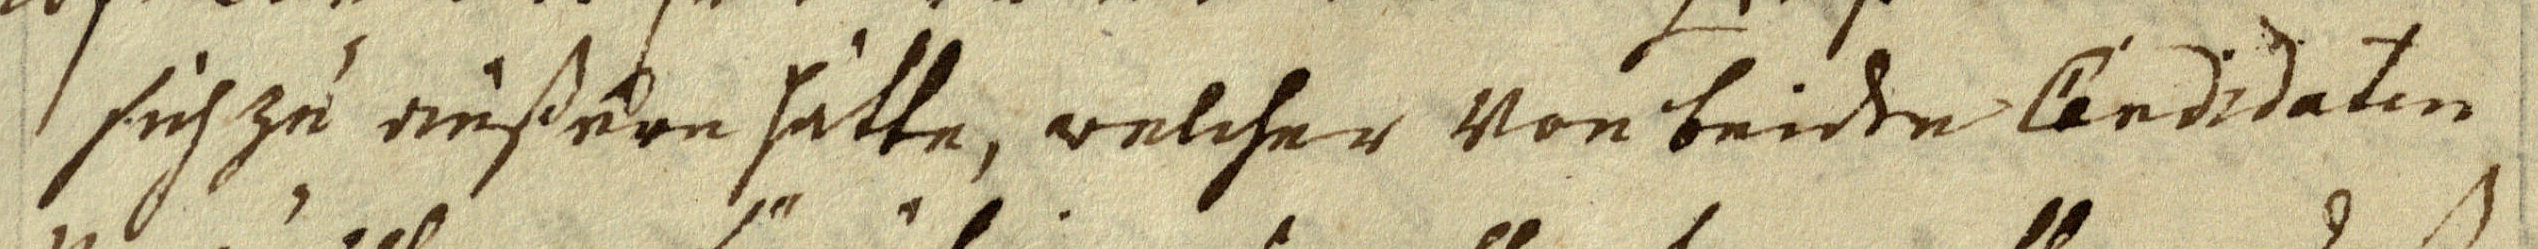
sich zu äußern hätte, welcher von beiden Candidaten
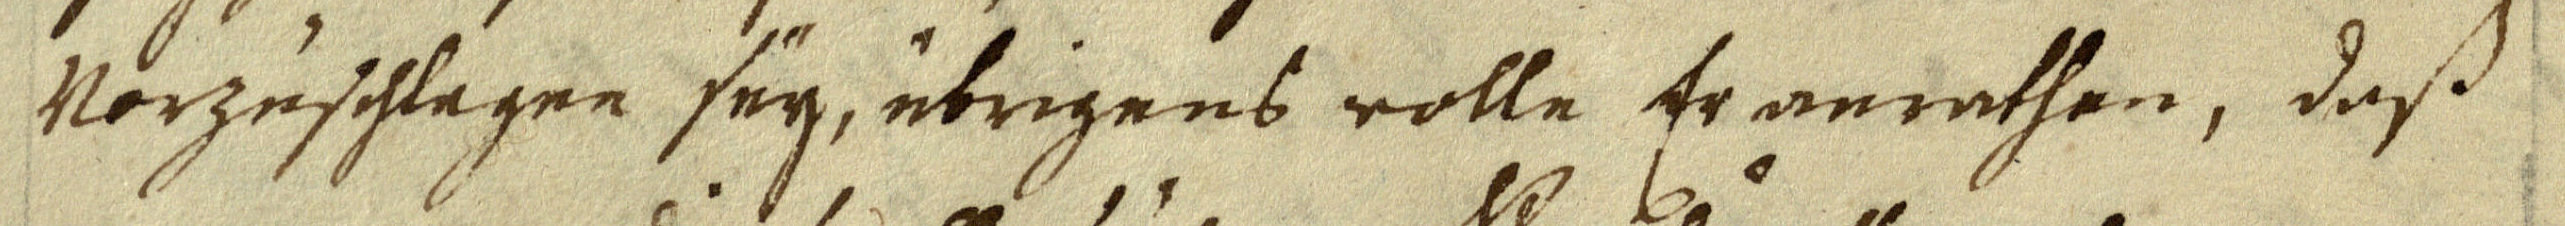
vorzuschlagen seÿ, übrigens wolle Er anrathen, daß
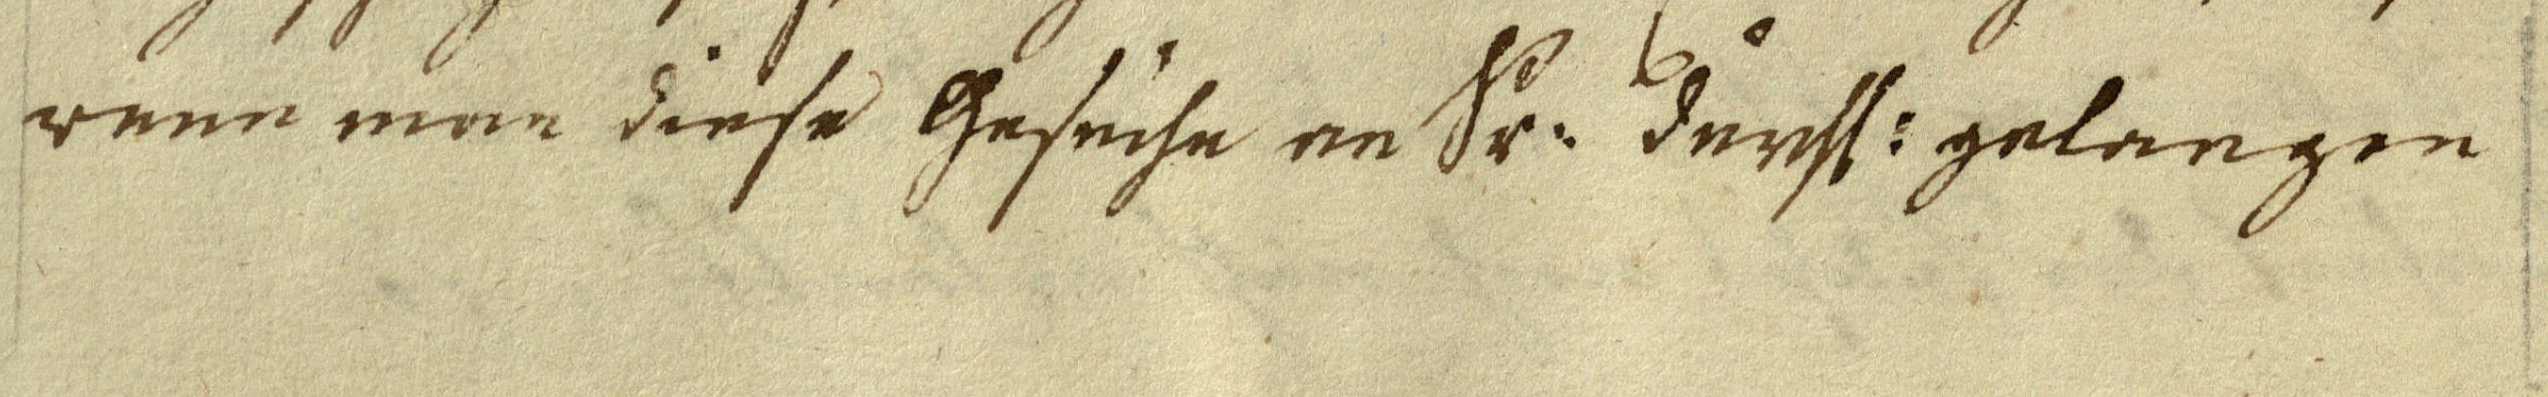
wenn man diese Gesuche an Sr Durchl. gelangen
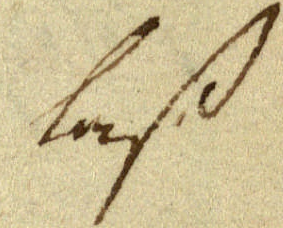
laß
